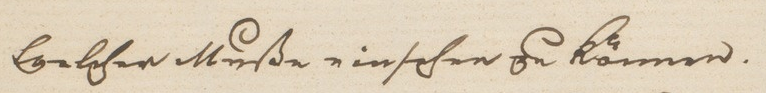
welcher Muße einsehen zu können.
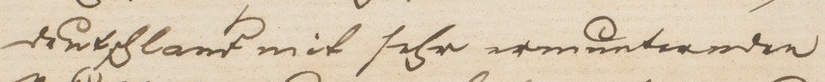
Deutschland mit sehr ermunternden
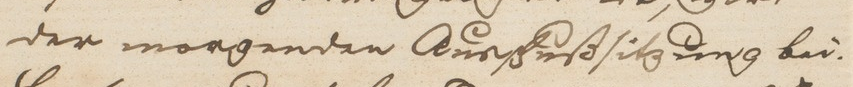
der morgendenAusschußsitzung bei-
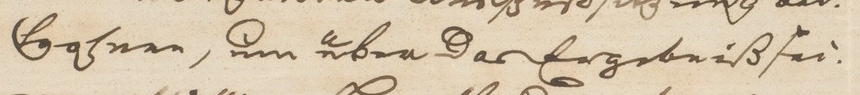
wohnen, um über das Ergebniß sei-
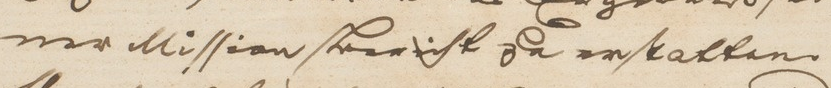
ner Mission Bericht zu erstatten.
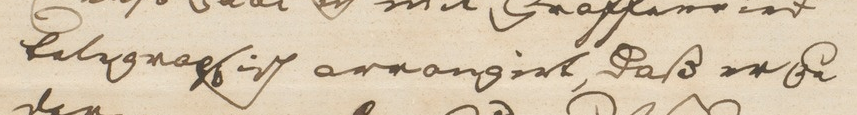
telegraphisch arrangirt, daß er zu
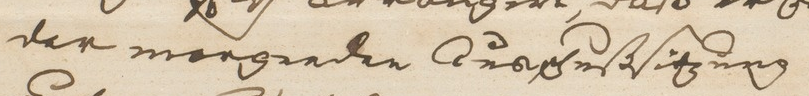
der morgenden Ausschußsitzung
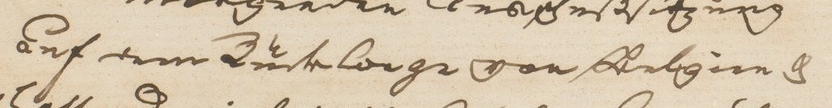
auf dem Rückwege von Belgien &
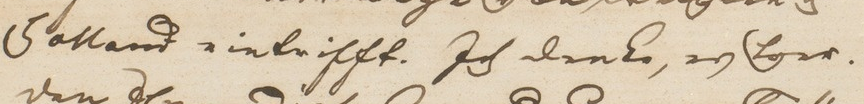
Holland eintrifft. Ich denke, es wer-
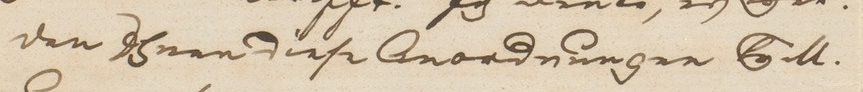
den Ihnen diese Anordnungen will-
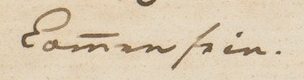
kommen sein.
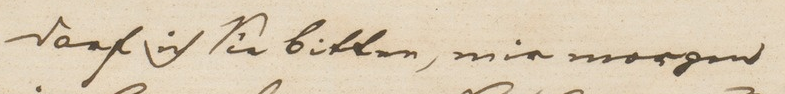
Darf ich Sie bitten, mir morgen
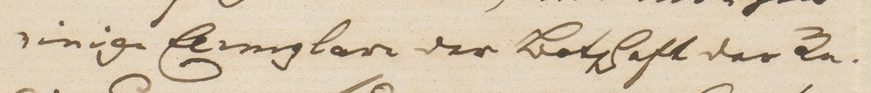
einige Exemplare der Botschaft der Re-
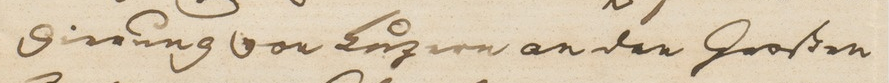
gierung von Luzern an den Großen
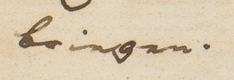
bringen.
